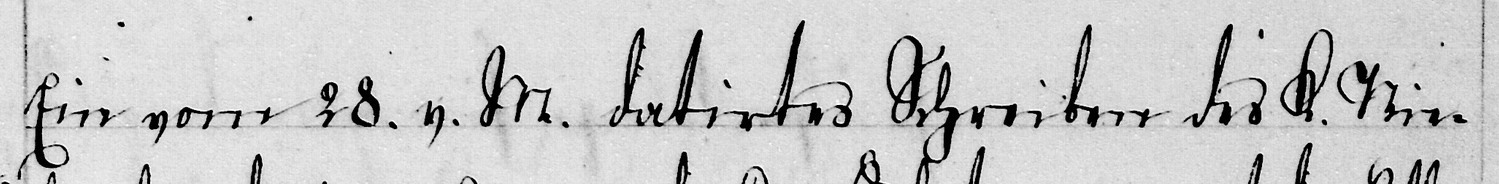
Ein vom 28. v. M. datirtes Schreiben des K. Nie¬
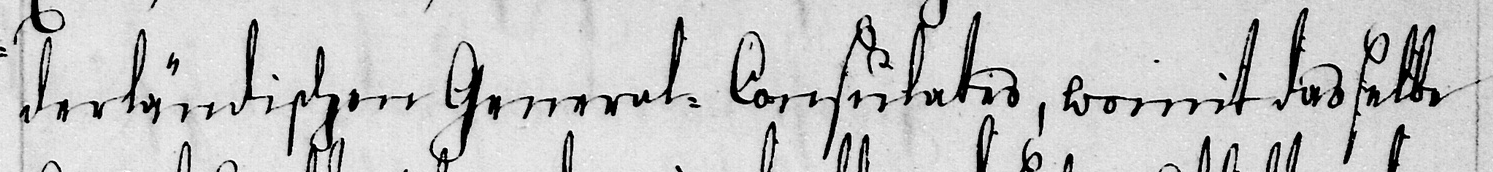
derländischen General-Consulates, womit dasselbe
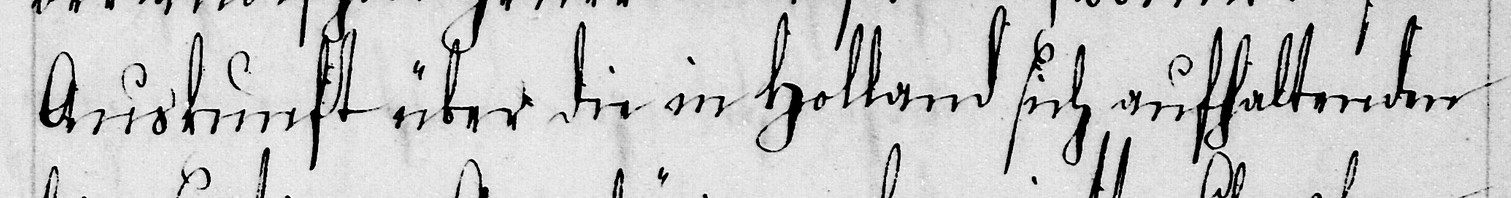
Auskunft über die in Holland sich aufhaltenden
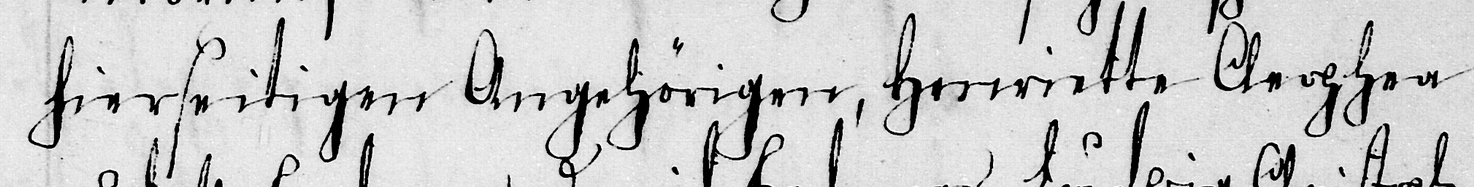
hierseitigen Angehörigen, Henriette Cleophea
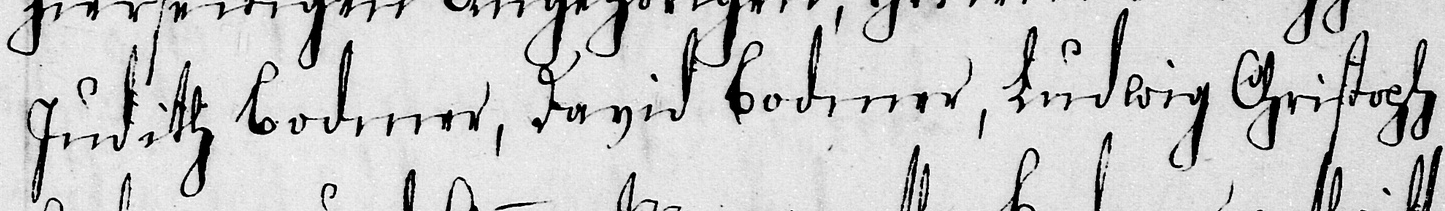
Judith Bodmer, David Bodmer, Ludwig Christoph
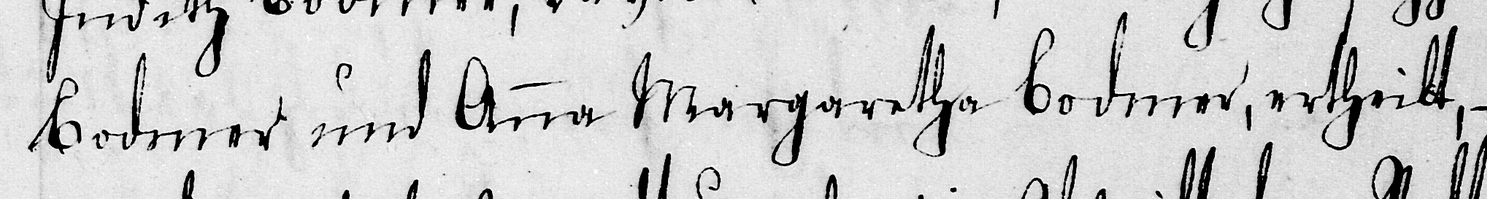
Bodmer und Anna Margaretha Bodmer, ertheilt,
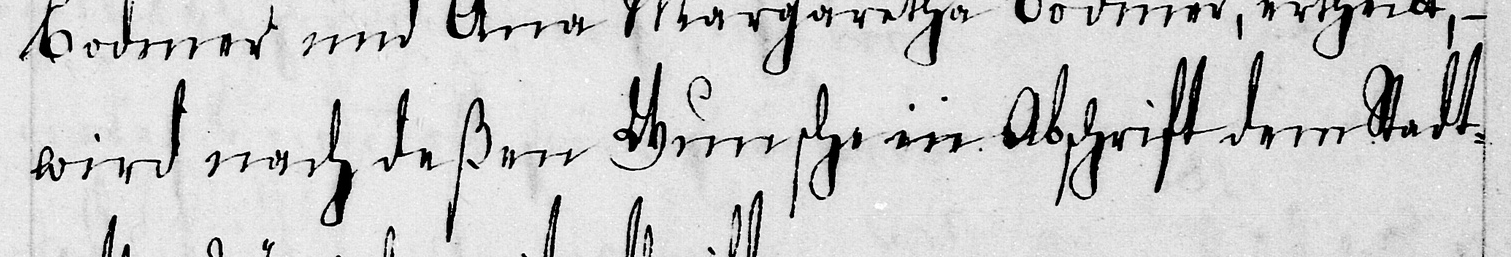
wird nach deßen Wunsche in Abschrift dem Stadt¬
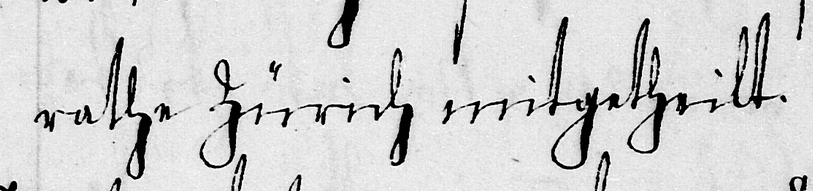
rathe Zürich mitgetheilt.
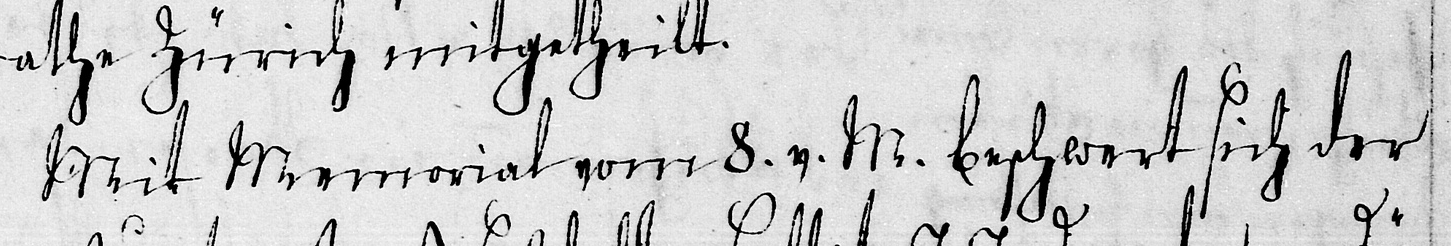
Mit Memorial vom 8. v. M. beschwert sich der
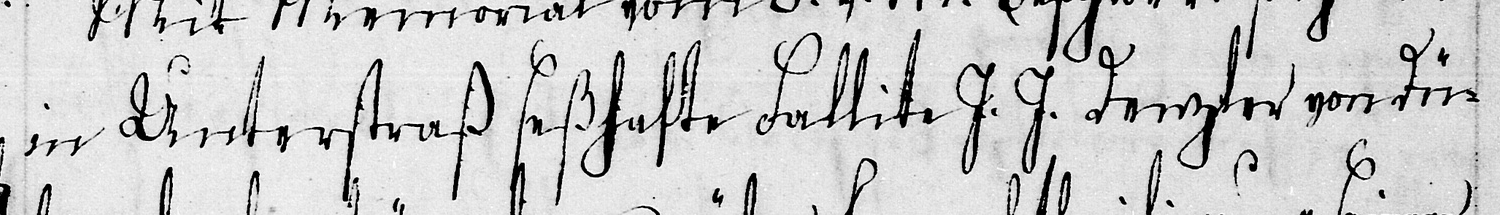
in Unterstraß seßhafte Fallite J. J. Denzler von Dü¬
